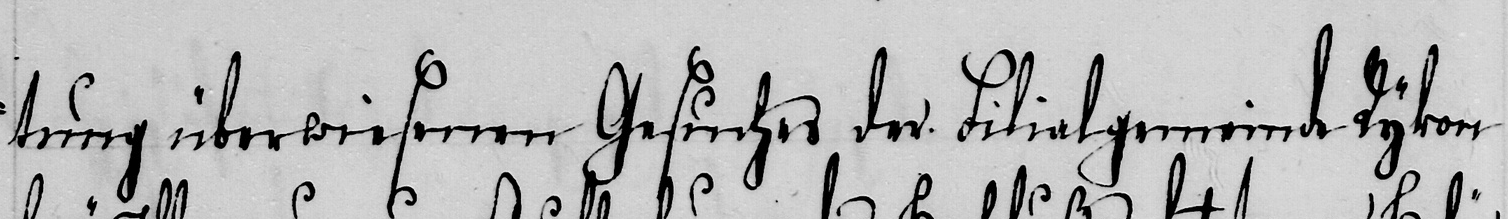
tung überwiesenen Gesuches der Filialgemeinde Rykon
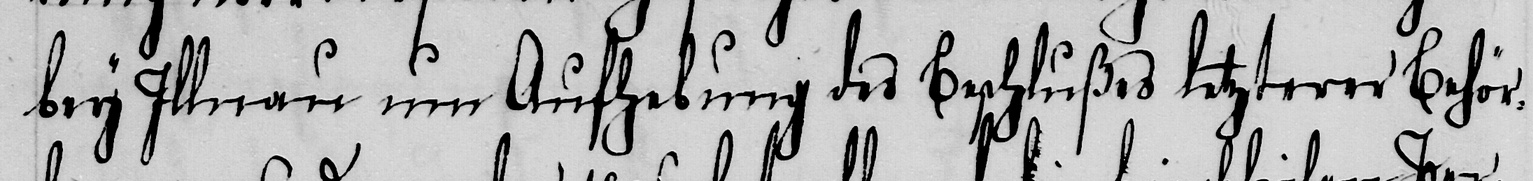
bey Illnau um Aufhebung des Beschlußes letzterer Behör¬
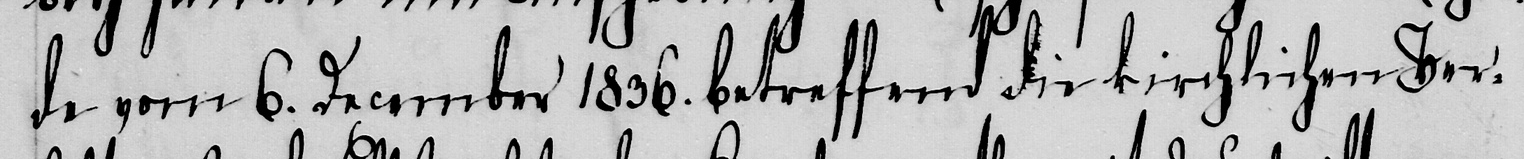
de vom 6. December 1836. betreffend die kirchlichen Ver¬
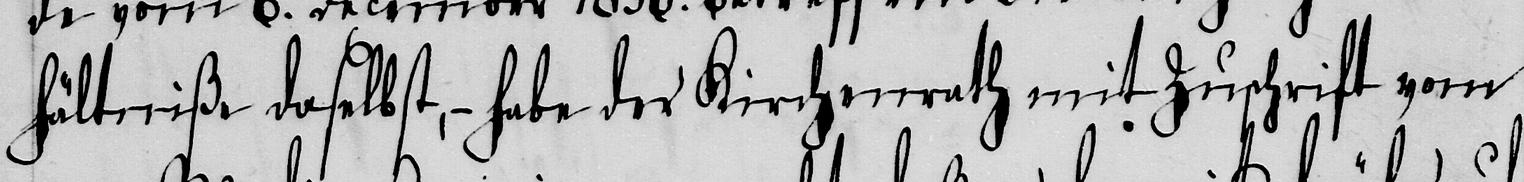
hältniße daselbst, – habe der Kirchenrath mit Zuschrift vom
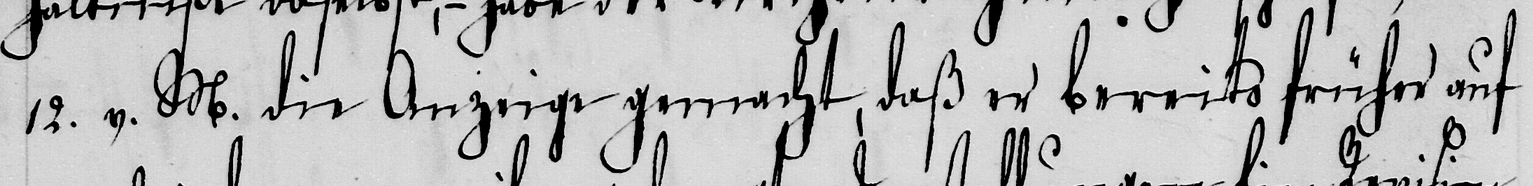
12. v. M. die Anzeige gemacht, daß er bereits früher auf
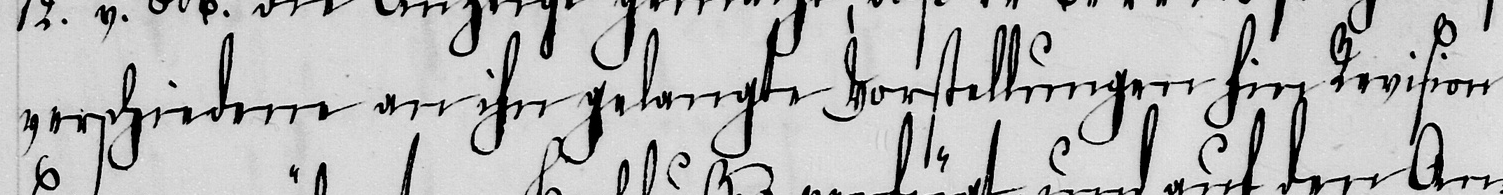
verschiedene an ihn gelangte Vorstellungen hin Revision
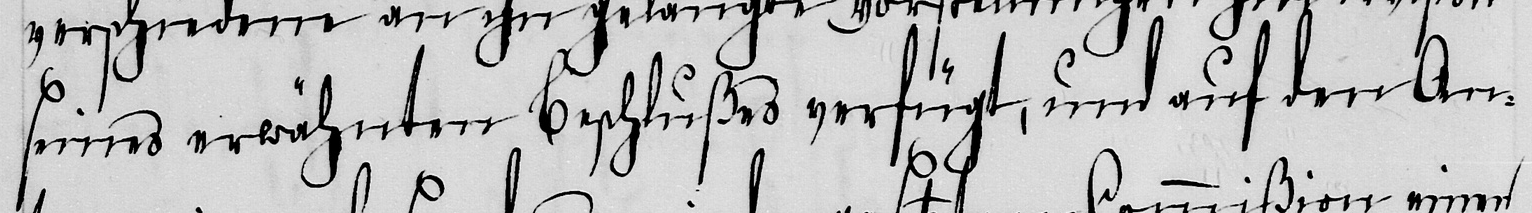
seines erwähnten Beschlußes verfügt, und den An¬
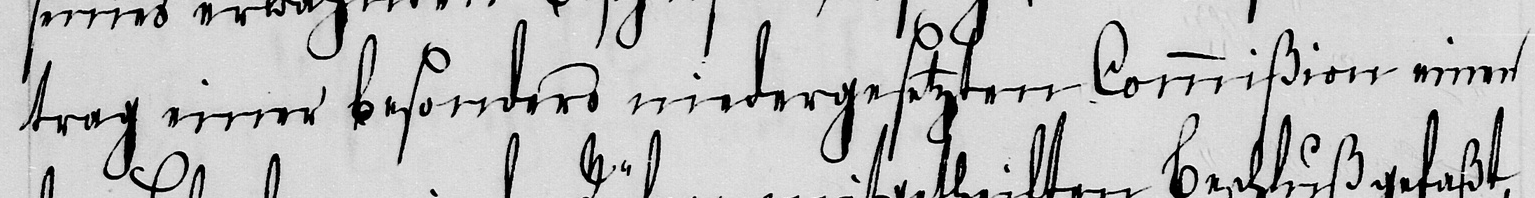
trag einer besonders niedergesetzten Commißion einen
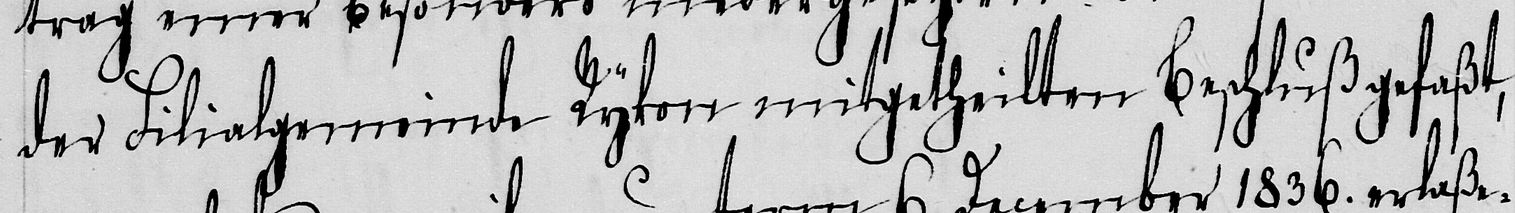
der Filialgemeinde Rykon mitgetheilten Beschluß gefaßt,
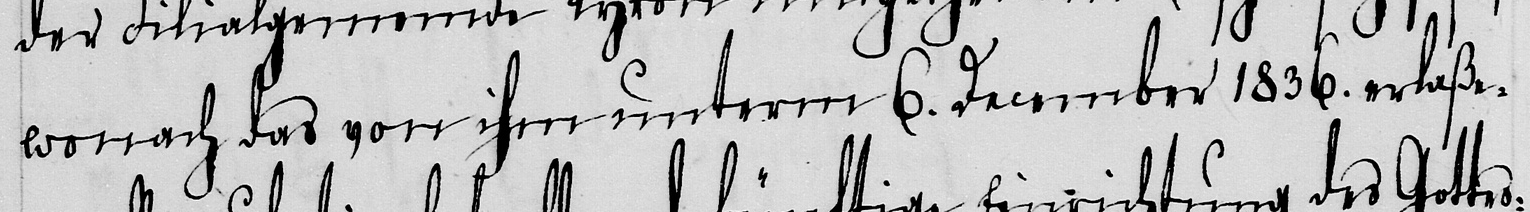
wonach das von ihm unterm 6. December 1836. erlaße¬
